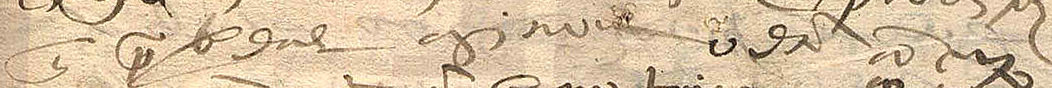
q̄ p̄o ꝟdade asinou o dtō c̄ocerto
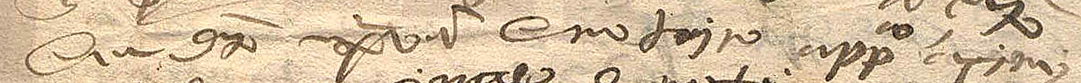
e eu dito esp̄vā e notajro appco asinej
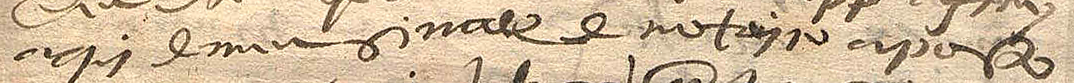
aquj de meu sinall de notajro aposto
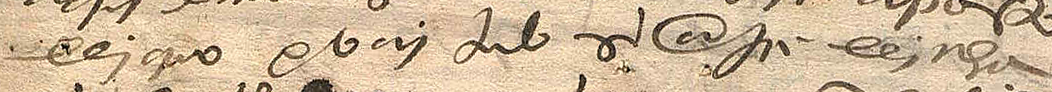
lljquo e vaj todo sē ātrelljnha
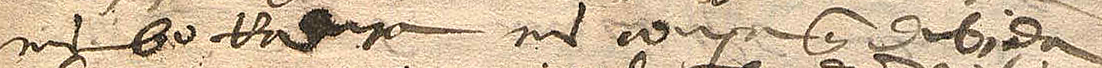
nē boRadura nē cousa q̄ duvida
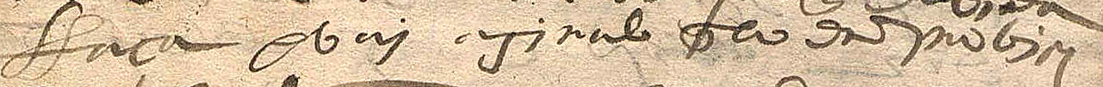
ffaça e vaj asinado p̄lo dtō provisor
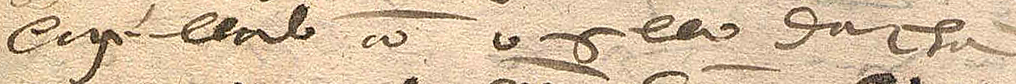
e asellado c̄o o sello da chā
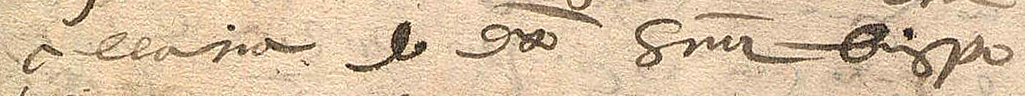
cellaria do d̄ito Snōr bispo
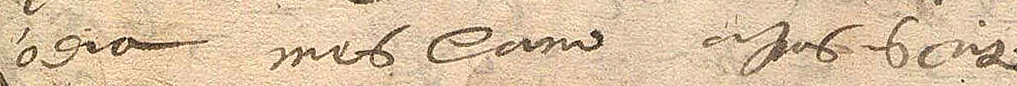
o dia mes e ano atras escrito
